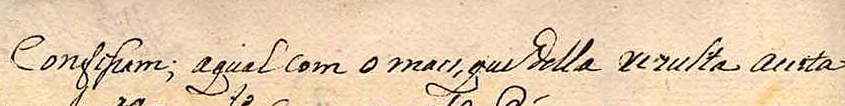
Confissam; a qual com o mais, que della rezulta aceita
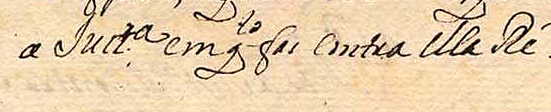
a Iust.a emqto fas contra ella Ré
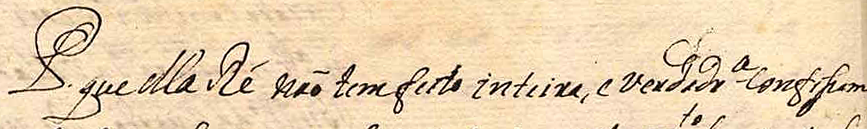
P. que ella Ré naõ tem feito inteira, e verdadr.a confissam
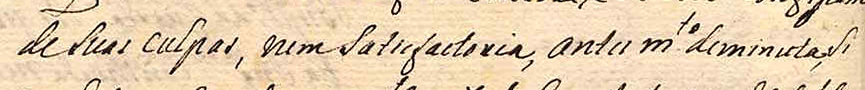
de suas culpas, nem satisfactoria, antes m.to deminuta, si
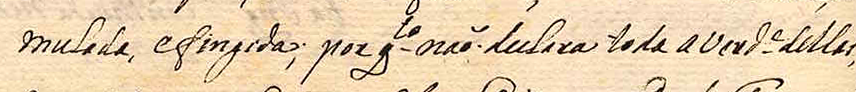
mulada, e fingida; porq. naõ declara toda a verd.e dellas,
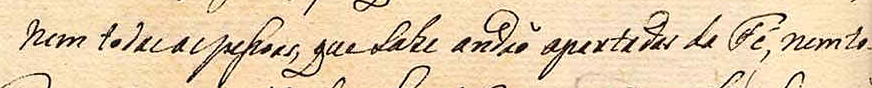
nem todas as pessoas, que sabe andaõ apartadas da Fé, nem to
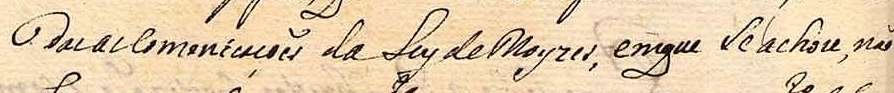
das as comonicaçoẽs da Ley de Moyzes, em que se achou, naõ
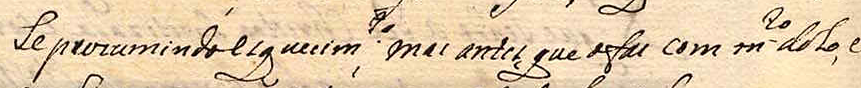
se prezumindo esquecim;to mas antes, que o fas com m.to dolo, e
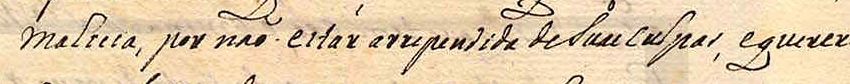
malicia, por naõ estar arrependida de Suas culpas, e querer
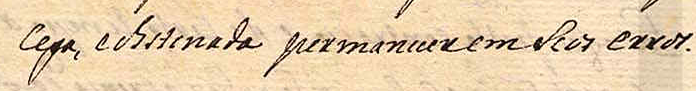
cega, e obstinada permanecer em seos erros.
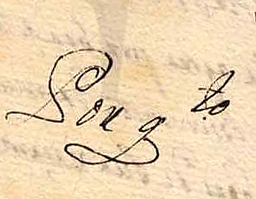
Porq.to
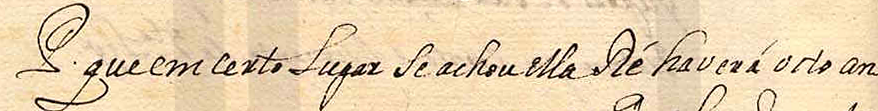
P. que em certo Lugar se achou ella Ré haverá oito an
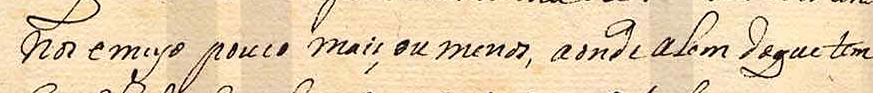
nos e meyo pouco mais, ou menos, aonde alem do que tem
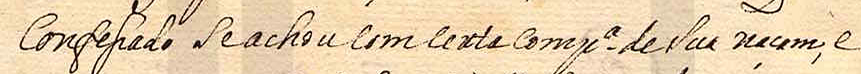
Confessado se achou com certa comp.a de sua naçam, e
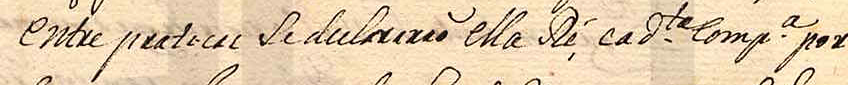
entre praticas se declararaõ ella Ré, e a d̄.ta comp.a por
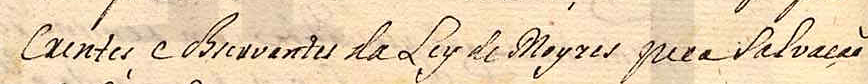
Crentes, e observantes da Ley de Moyzes pera salvaçaõ
